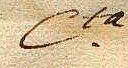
Ct.a
